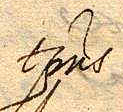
tpūs
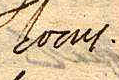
locus.
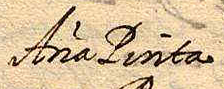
An̄a Pinta.
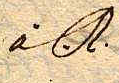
a .R.
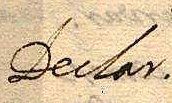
Declar.
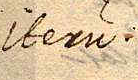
iterū.
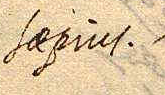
sæpius. -
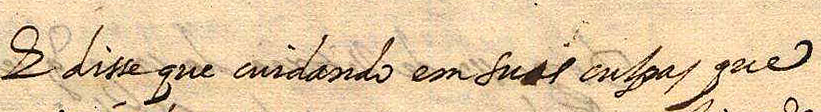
E disse que cuidando em suas culpas que
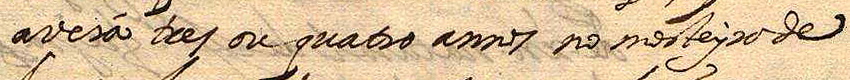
averá tres ou quatro annos no mosteyro de
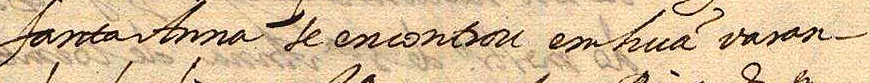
Santa Anna se encontrou em huā varan
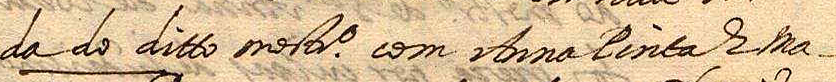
da do ditto mostr.o com Anna Pinta E Ma
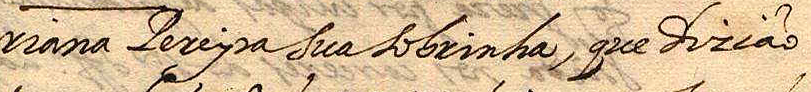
riana Pereyra sua sobrinha, que diziaõ
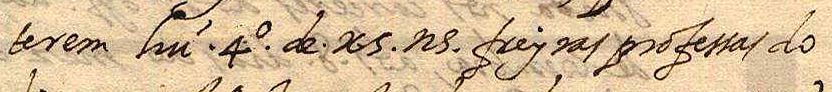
terem hū .4o. de .xs. ns. freyras professas do
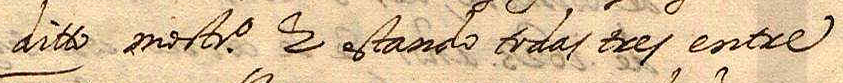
ditto mostr.o E estando todas tres entre
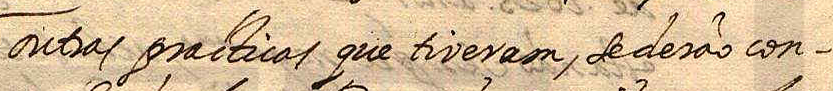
outras practicas que tiveram, se deraõ con
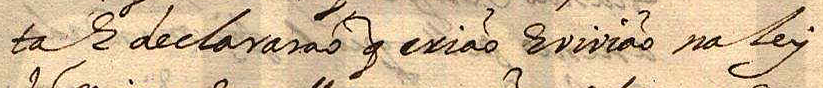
ta E declararaõ q̄ criaõ E viviaõ na ley
